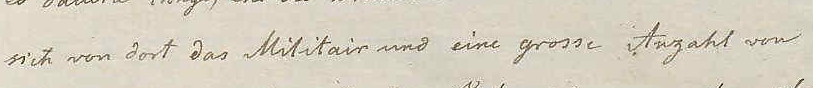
sich von dort das Militair und eine grosse Anzahl von
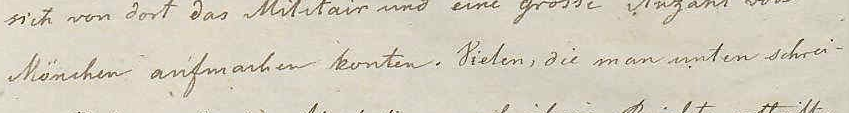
Mönchen aufmachen konten. Vielen, die man unten schrei-
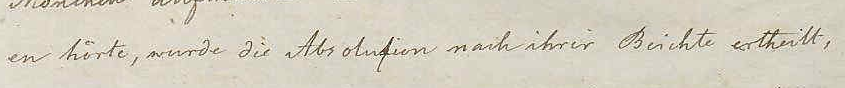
en hörte, wurde die Absolutzion nach ihrer Beichte ertheilt,
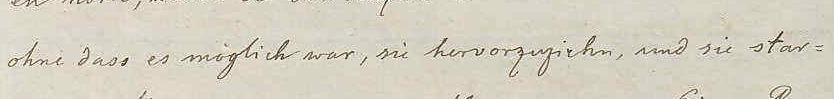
ohne dass es möglich war, sie hervorzuziehen, und sie star-
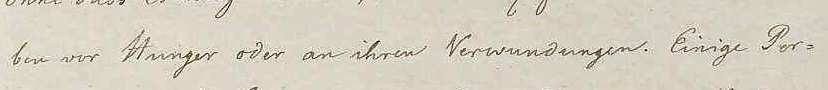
ben vor Hunger oder an ihren Verwundungen. Einige Per-
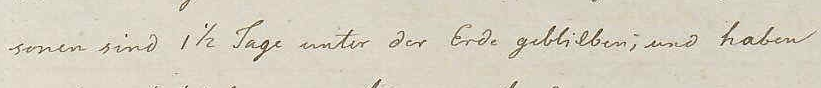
sonen sind 1½ Tage unter der Erde geblieben; und haben
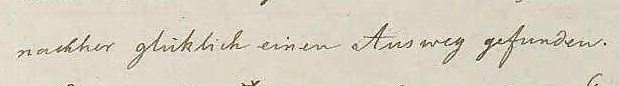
nachher glüklich einen Ausweg gefunden.
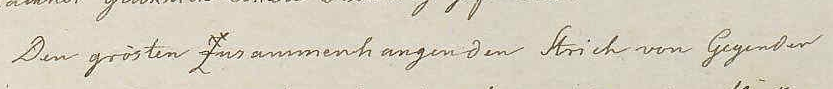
Den grösten Zzusammenhangenden Strich von Gegenden
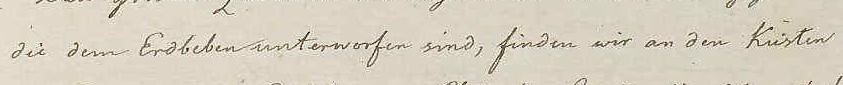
die dem Erdbeben unterworfen sind, finden wir an den Küsten
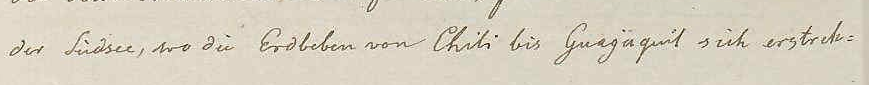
der Südsee, wo die Erdbeben von Chili bis Guayaquil sich erstrek-
